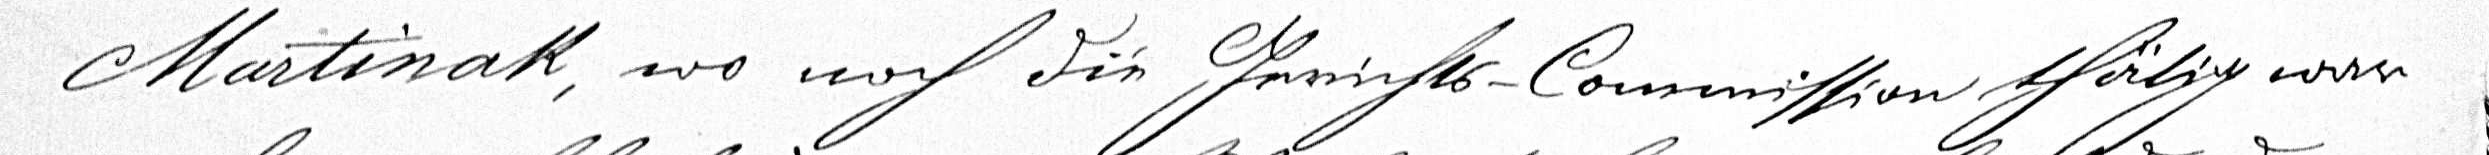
Martinak, wo noch die Gerichts-Commission thätig war
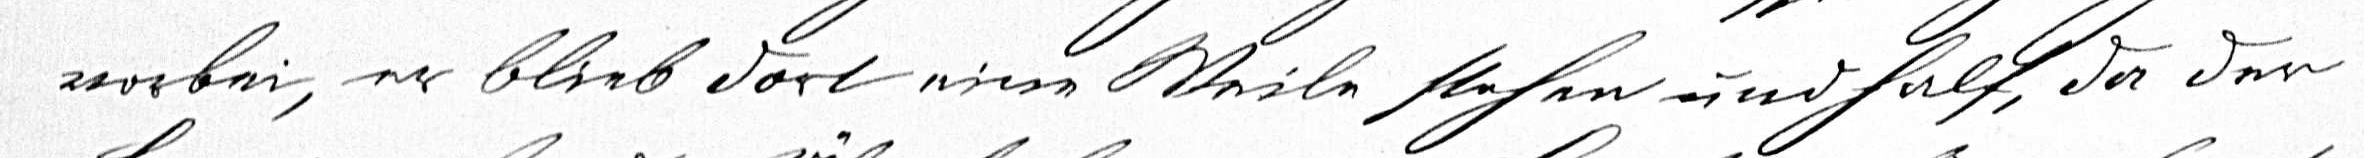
vorbei, er blieb dort eine Weile stehen und half, da der
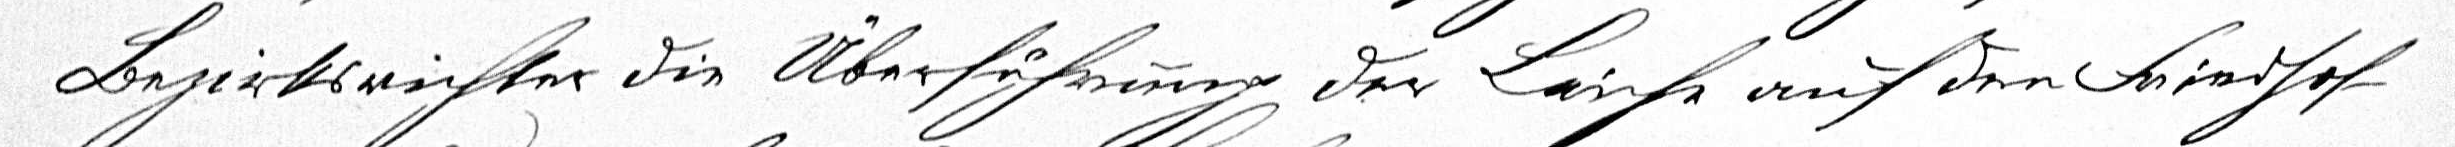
Bezirksrichter die Überführung der Leiche auf den Friedhof
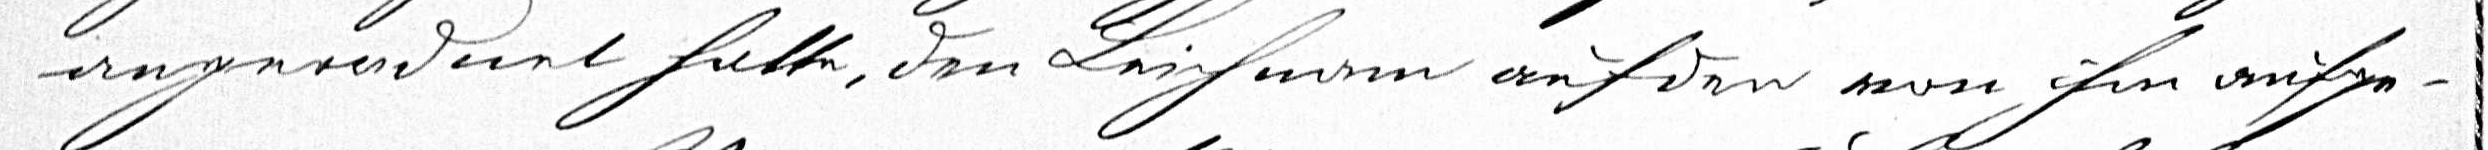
angeordnet hatte, den Leichnam auf den von ihm aufge¬
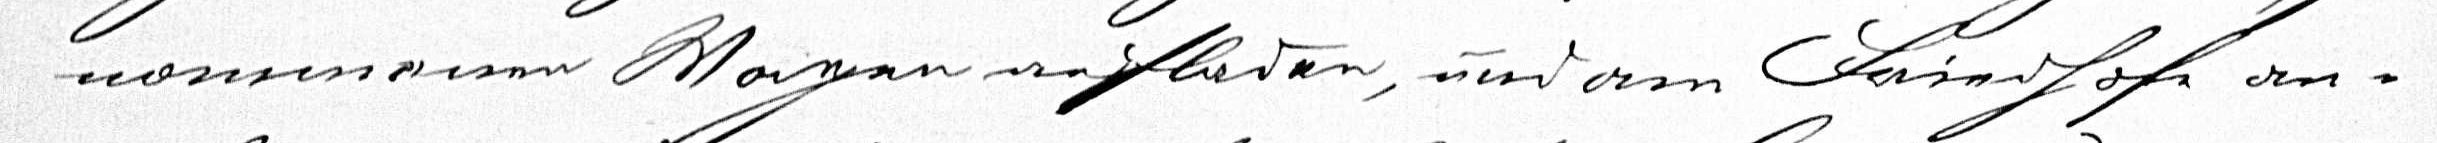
nommenen Wagen aufladen, und am Friedhofe an¬
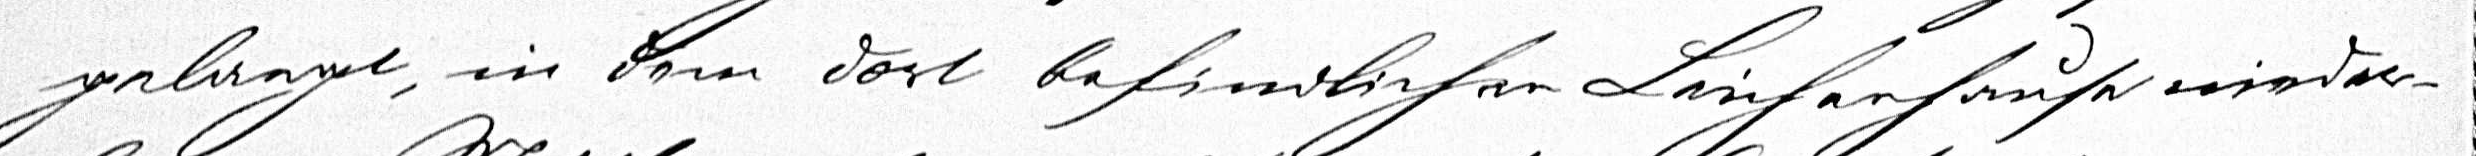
gelangt, in dem dort befindlichen Leichanhause wieder¬
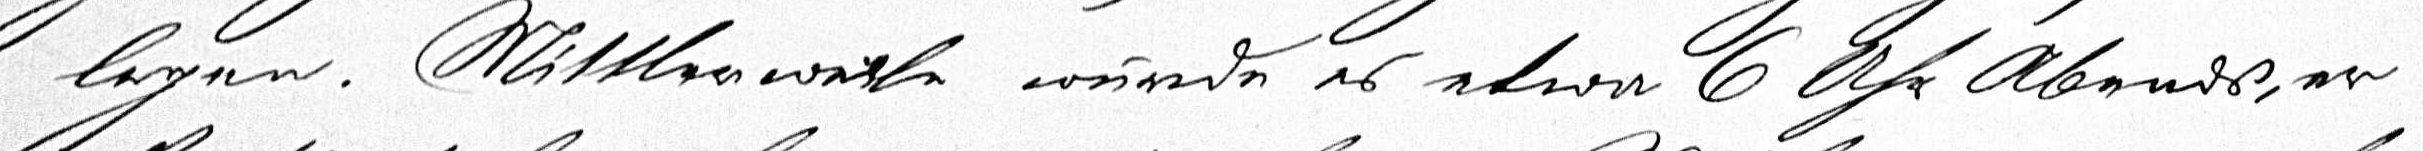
legen. Mittlerweile wurde es etwa 6 Uhr Abends, er
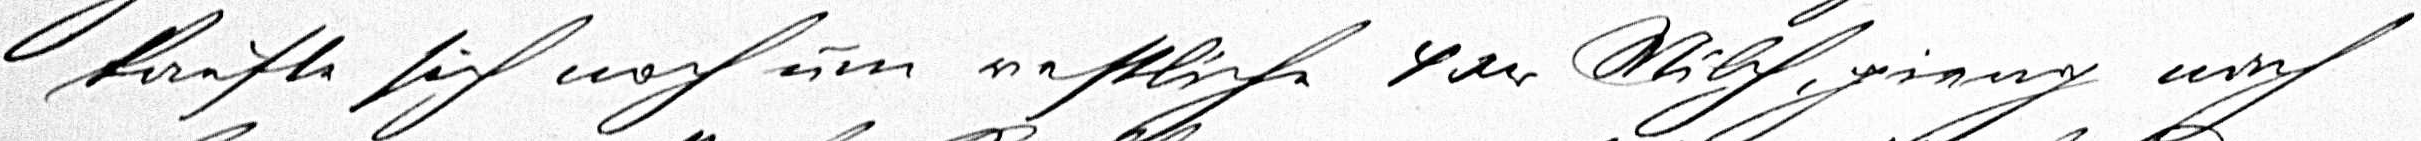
kaufte sich noch um restliche 4 xr Milch, gieng nach
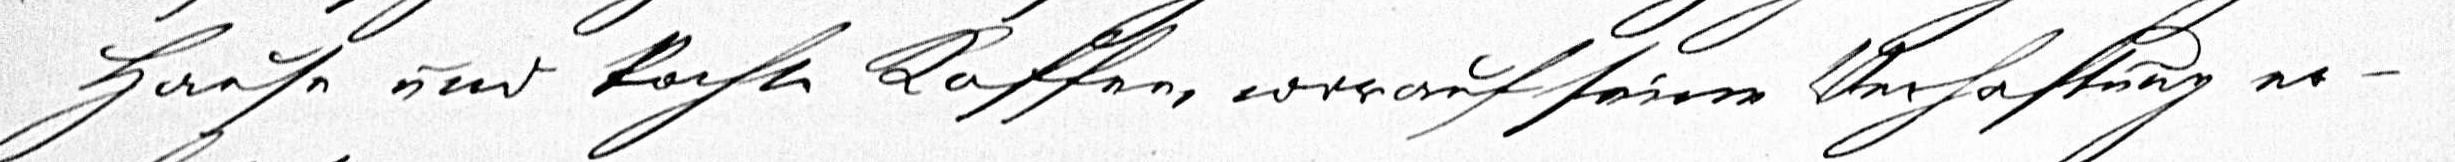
Huase und kochte Kaffee, worauf seine Verhaftung er¬
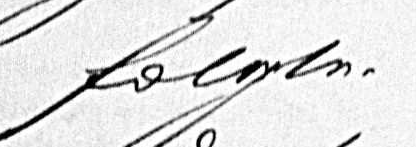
folgte.
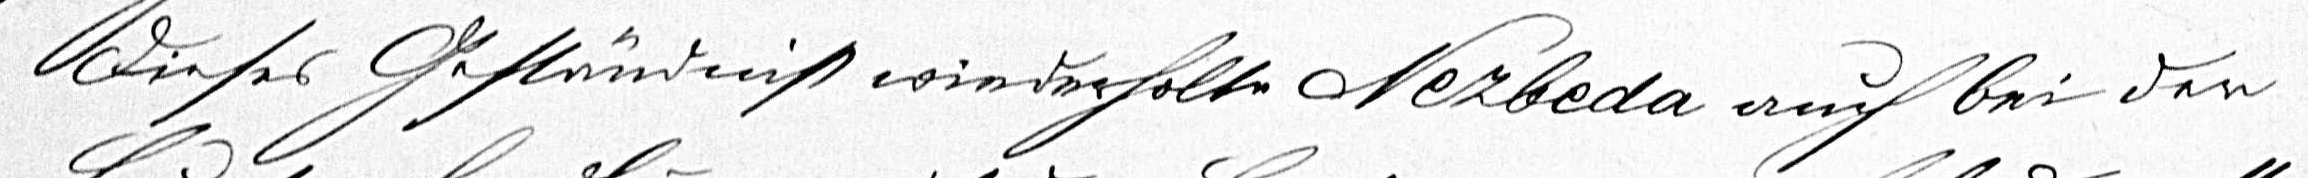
Dieses Geständniß wiederholte Nezbeda auch bei der
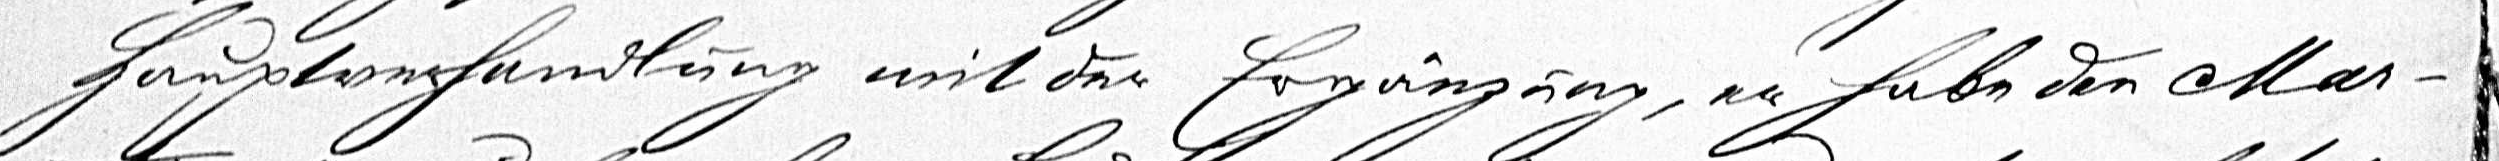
Hauptverhandlung mit der Ergänzung, er habe den Mar¬
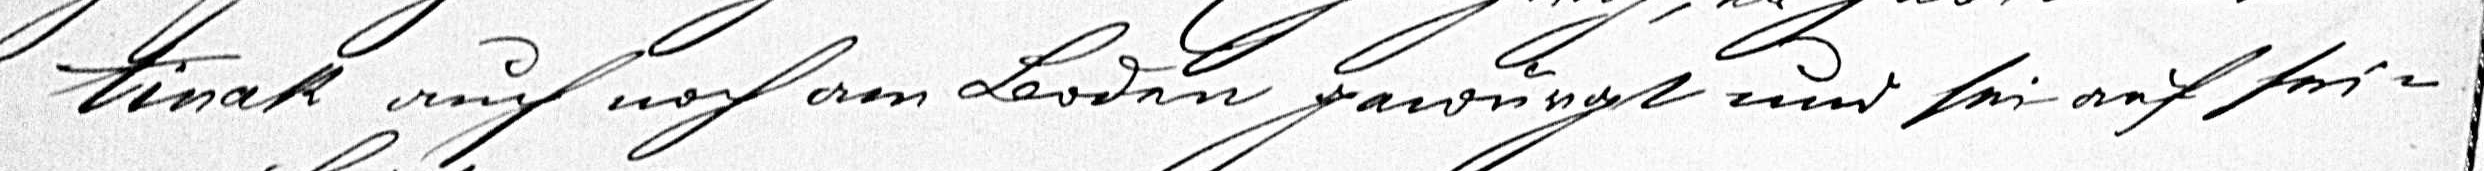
tinak auch noch am Boden gewürgt und sei auf sei¬
